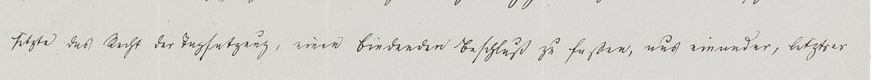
setzte das Recht der Tagsatzung, einen bindenden Beschluß zu fassen, auseinander, letztrer
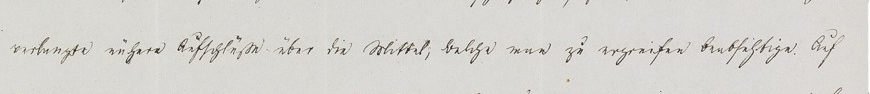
verlangte nähere Aufschlüsse über die Mittel, welche man zu ergreifen beabsichtige. Auf
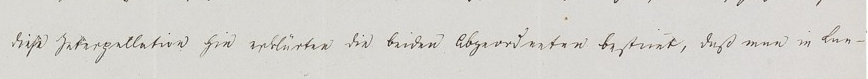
diese Interpellation hin erklärten die beiden Abgeordneten bestimmt, daß man in Lan-
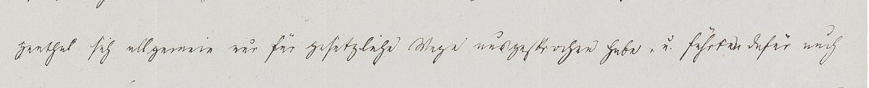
genthal sich allgemein nur für gesetzliche Wege ausgesprochen habe, u. führten dafür auch
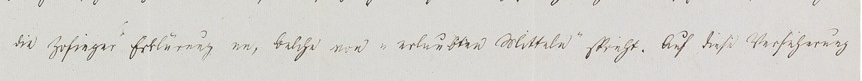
die Zofinger Erklärung an, welche von «erlaubten Mitteln» spricht. Auf diese Versicherung
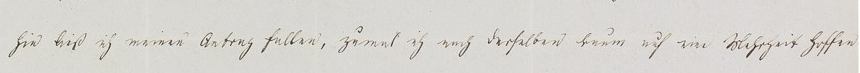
hin ließ ich meinen Antrag fallen, zumal ich nach derselben kaum auf eine Mehrheit hoffen
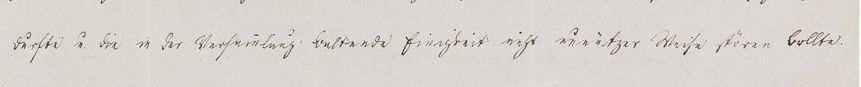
durfte u. die in der Versammlung waltende Einigkeit nicht unnützer Weise stören wollte.
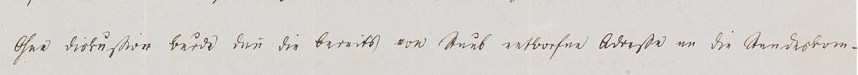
Ohne Diskussion wurde dann die bereits von Staub entworfne Adresse an die Standeskom-
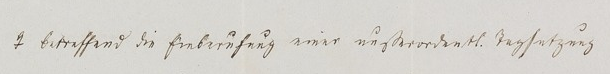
‡ betreffend die Einberufung einer außerordentl. Tagsatzung
